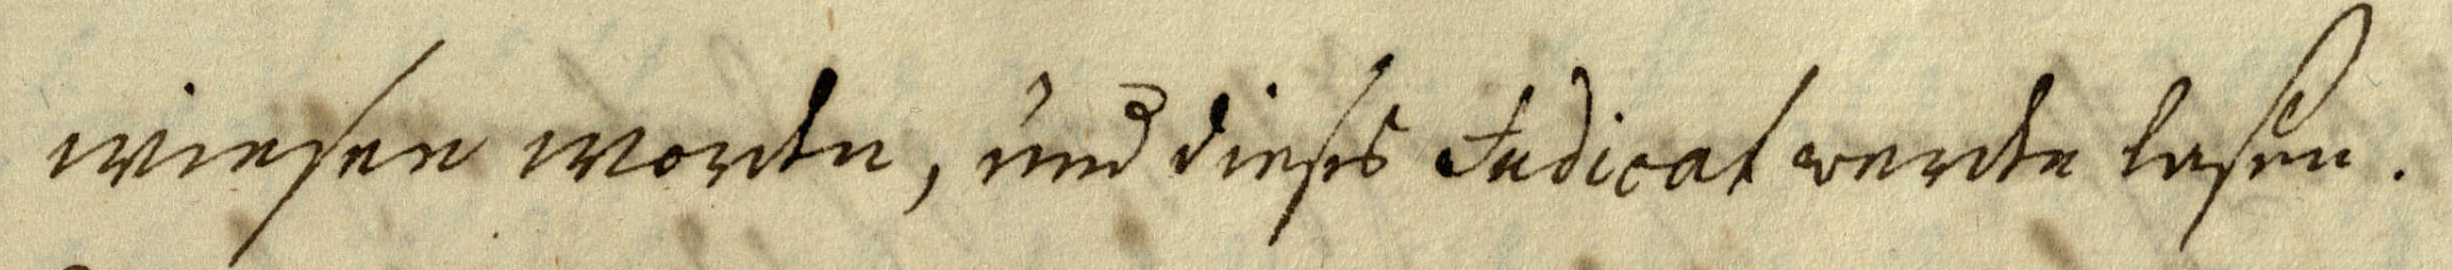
wiesen worden, und dieses Judicat werden laßen.
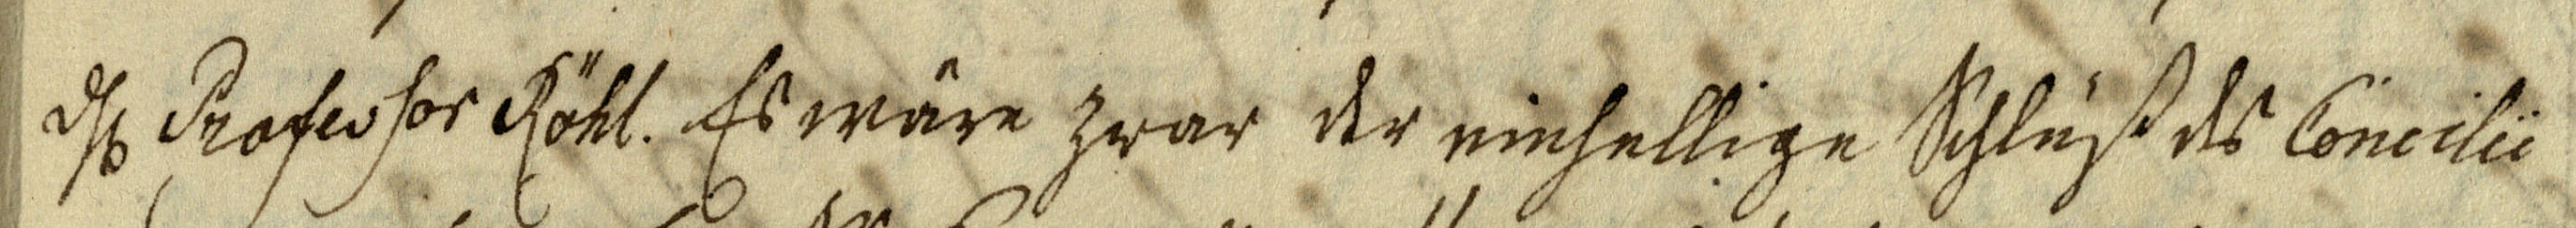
dh Professor Röhl. Es wäre zwar der einhellige Schluß des Concilii
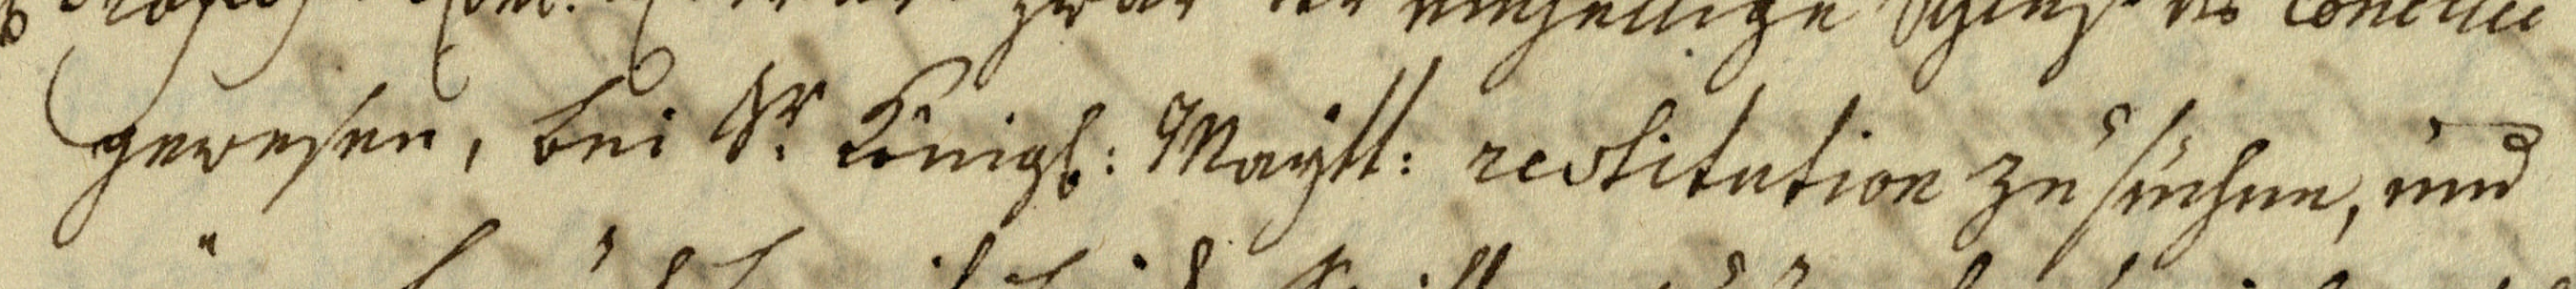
gewesen, bei Sr: Königl: Maÿst: resolution zu suchen, und
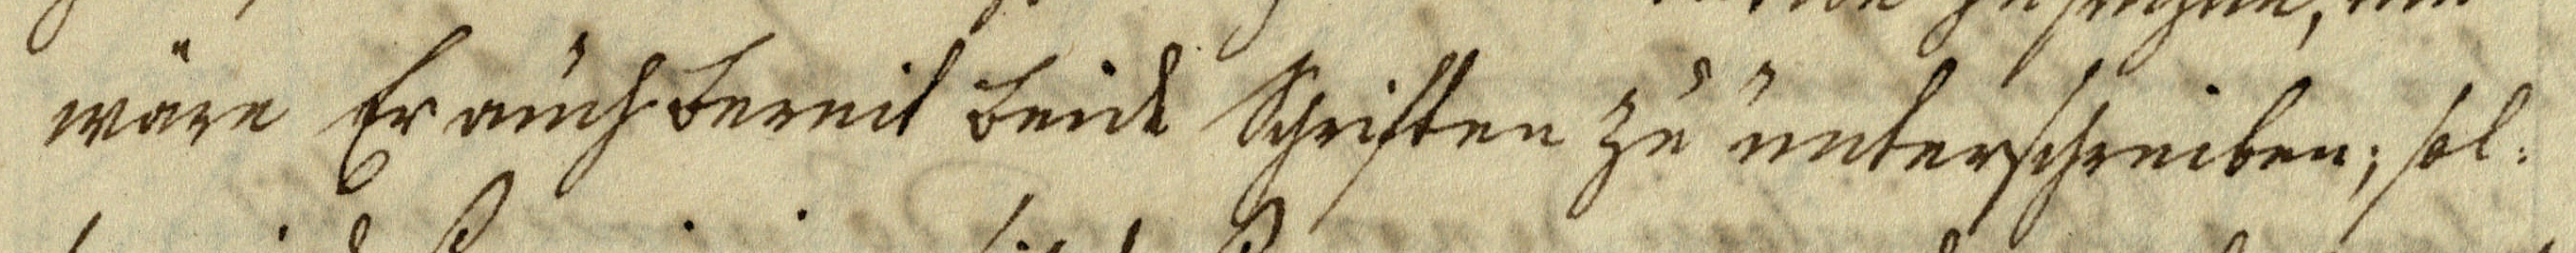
wäre Er auch bereit, beide Schriften zu unterschreiben; sol¬
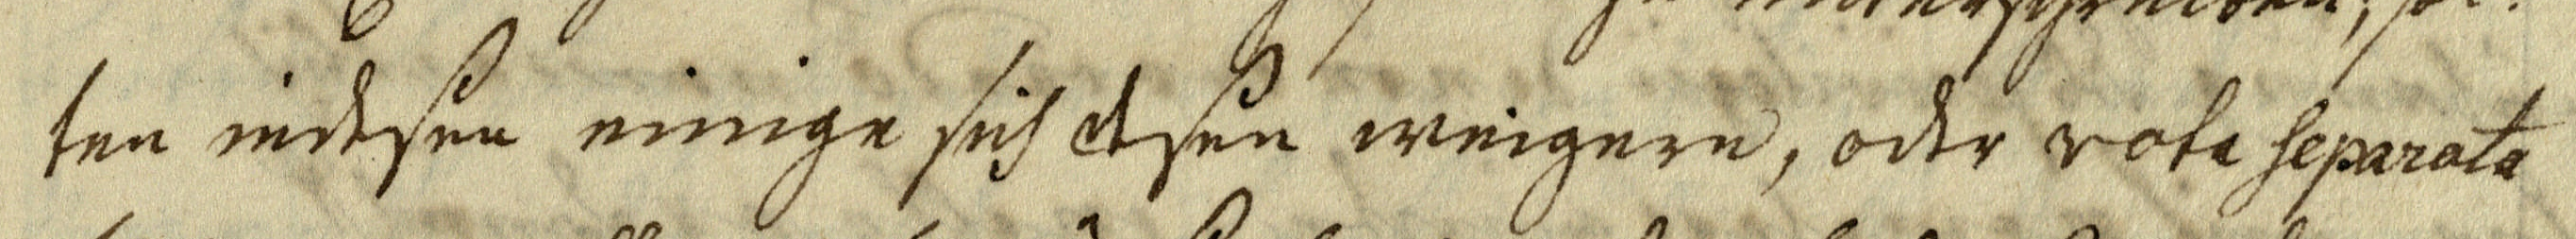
ten indeßen einige sich dessen weigern, oder vota separata
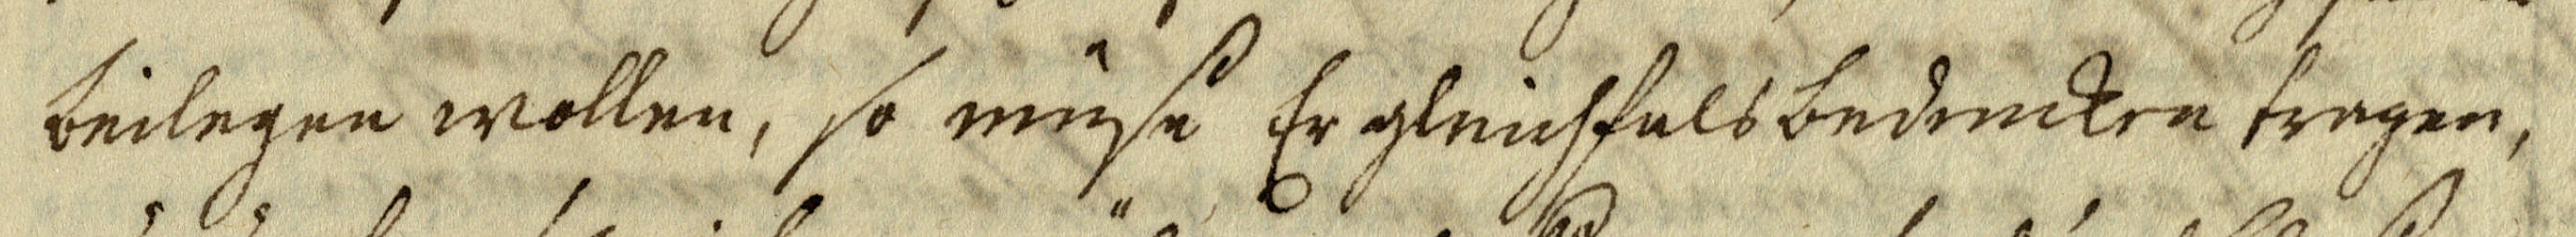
beilegen wollen, so müße er gleichfals Bedencken tragen,
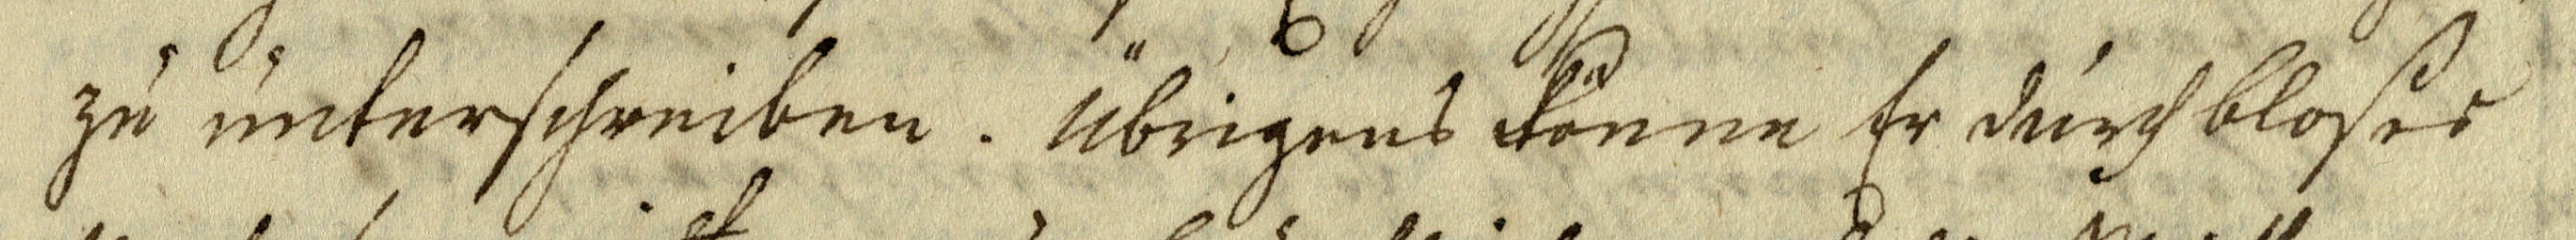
zu unterschreiben. Übrigens könne Er durch bloßes
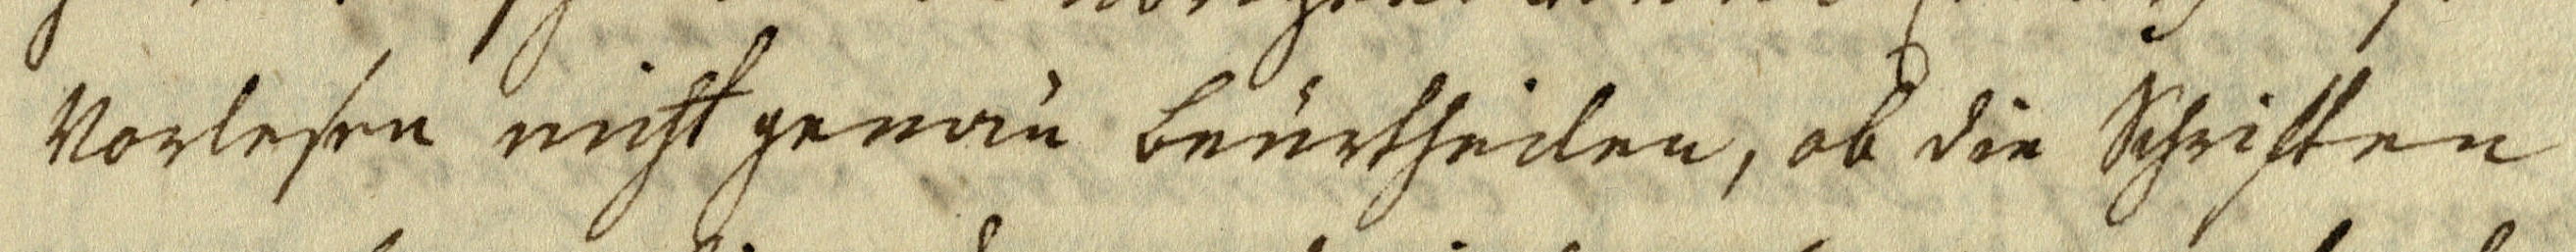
Vorlesen nicht genau beurtheilen, ob die Schriften
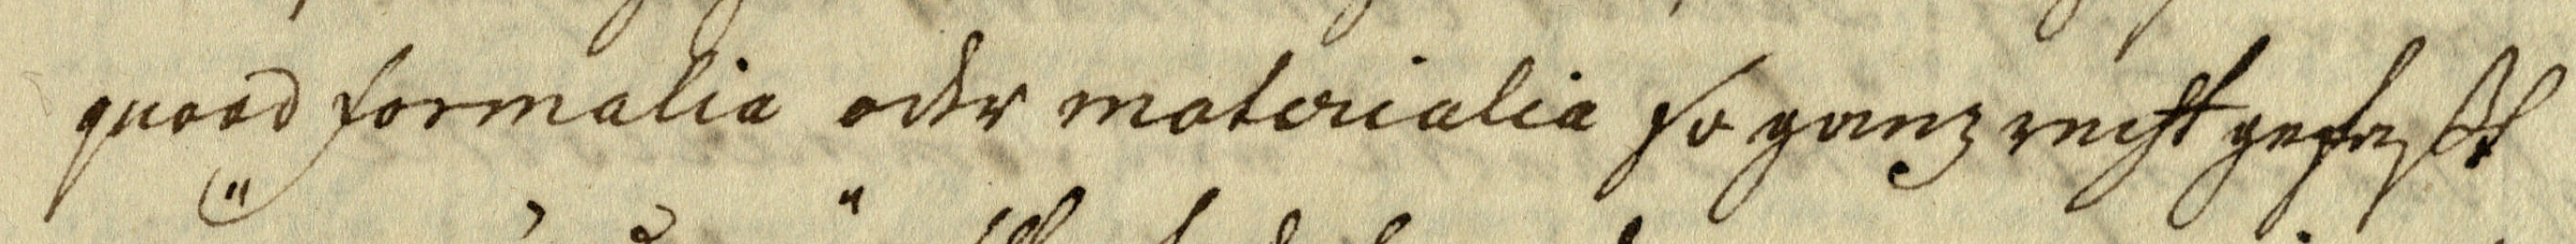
quod formalia oder materialia so ganz recht gefaßt
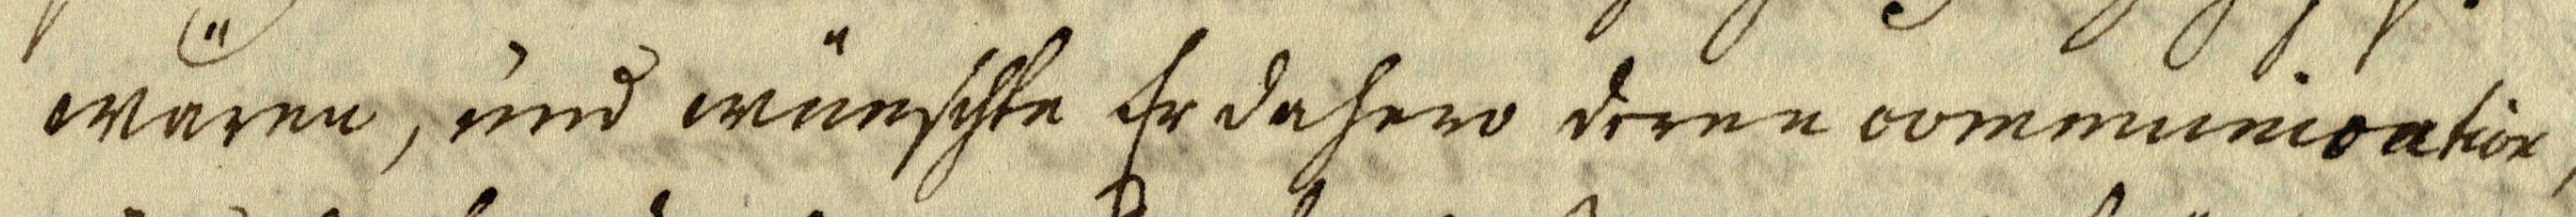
wären, und wünschte Er dahero deren communication
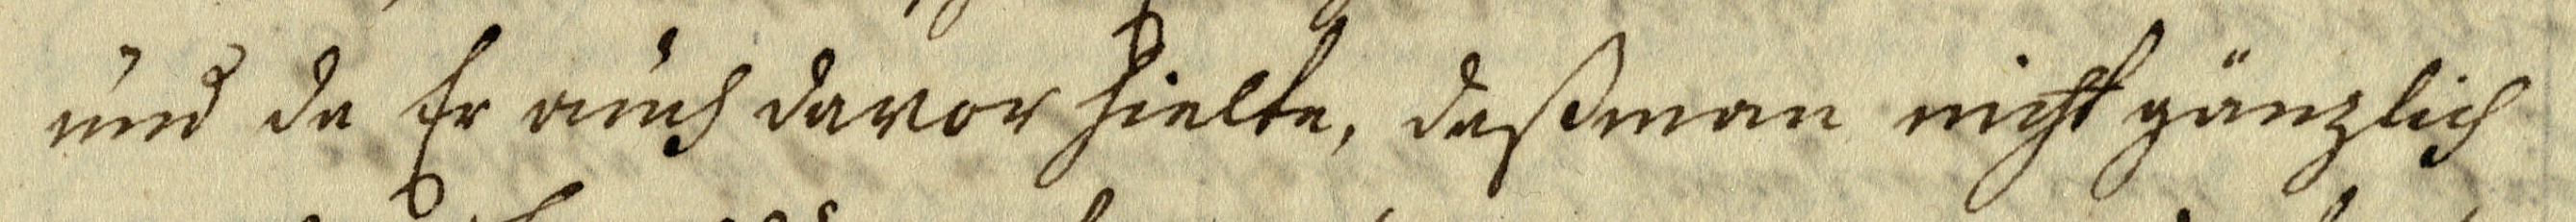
und da Er auch davor hielte, daßman nicht gänzlich
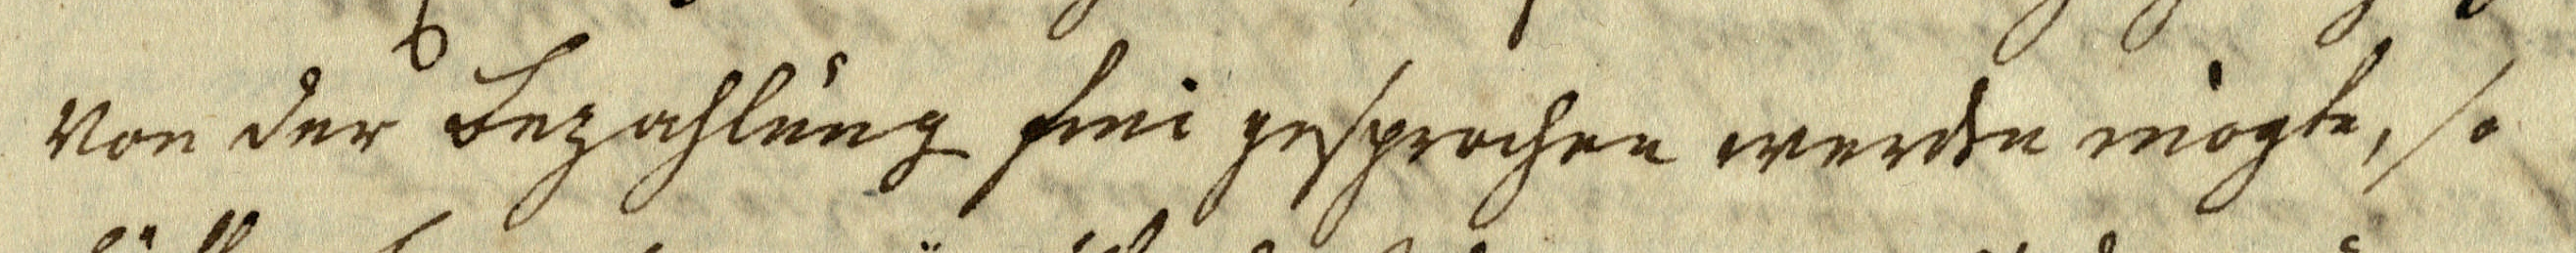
von der Bezahlung frei gesprochen werden mögte, so
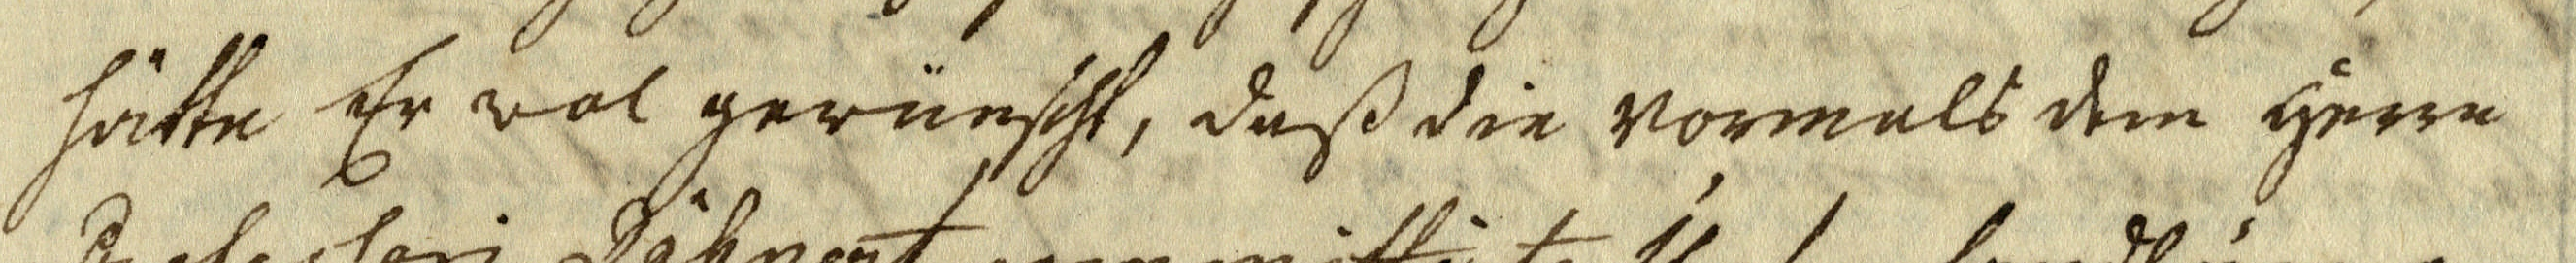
hätte Er wol gewünscht, daß die vormals dem Herrn
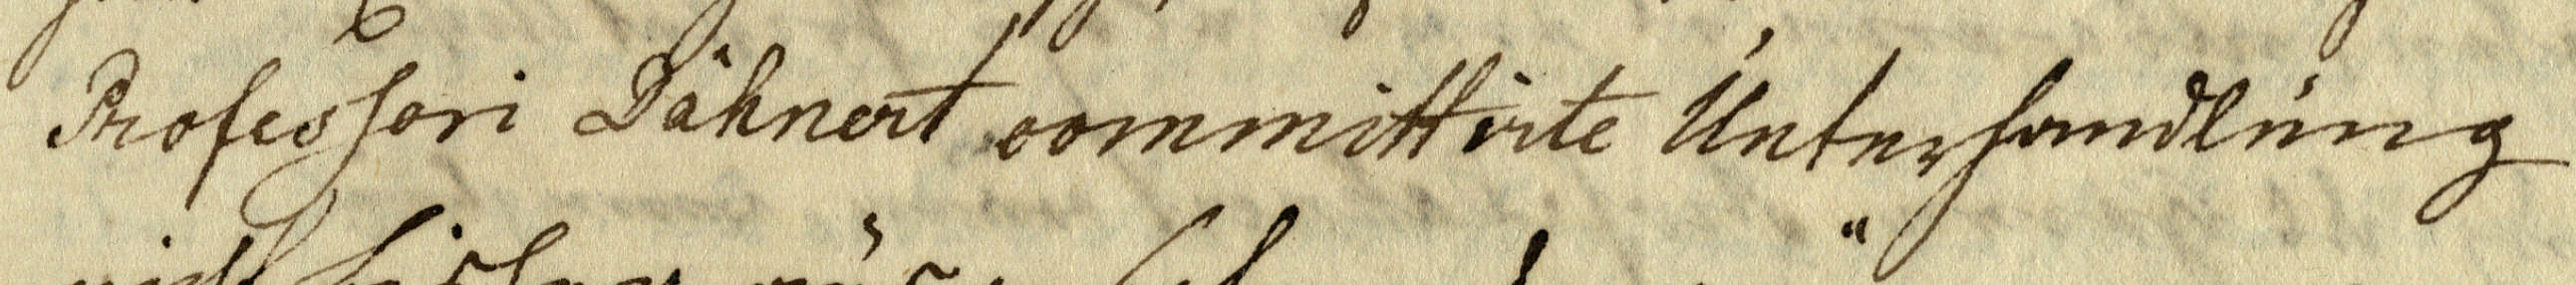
Professori Dähnert committirte Unterhandlung
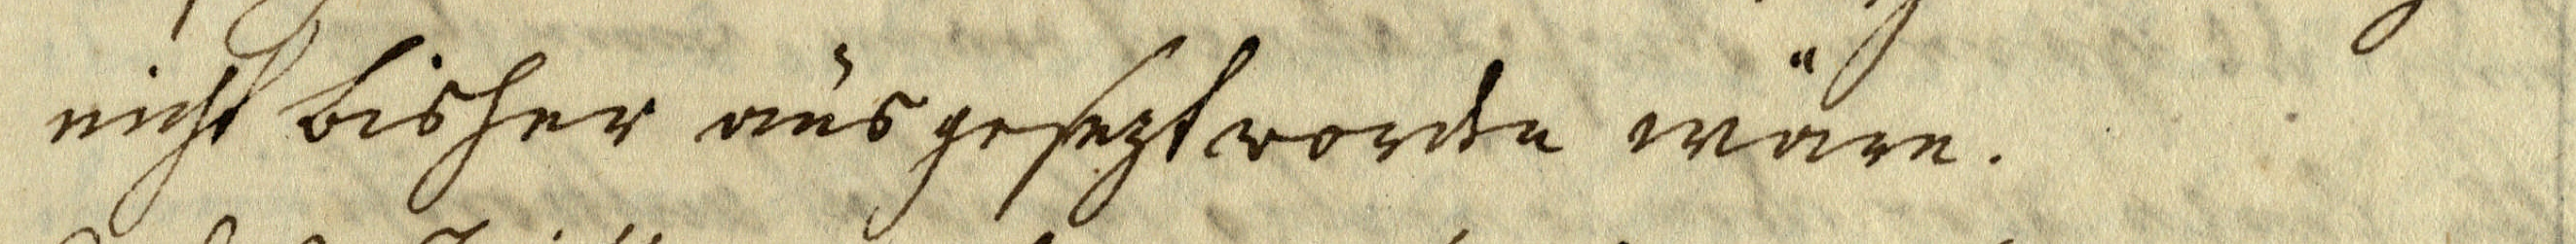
nicht bisher ausgesezt worden wäre.
